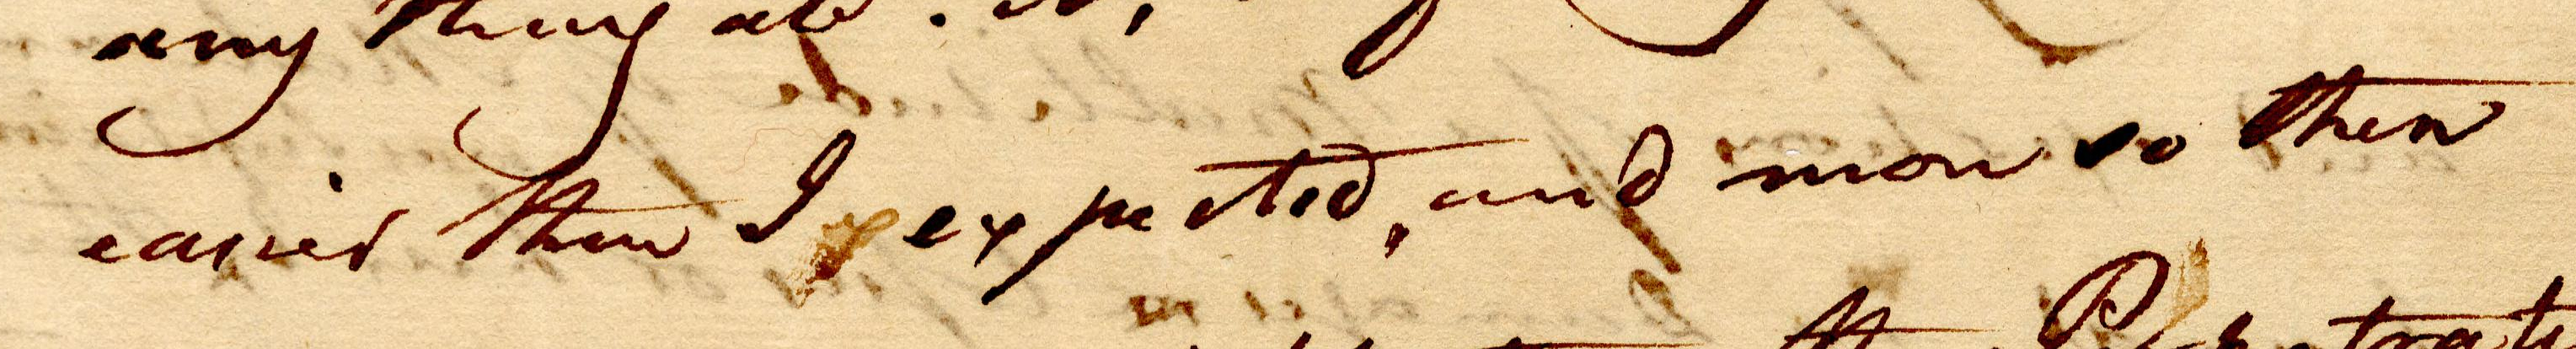easier then I expected, and now so then
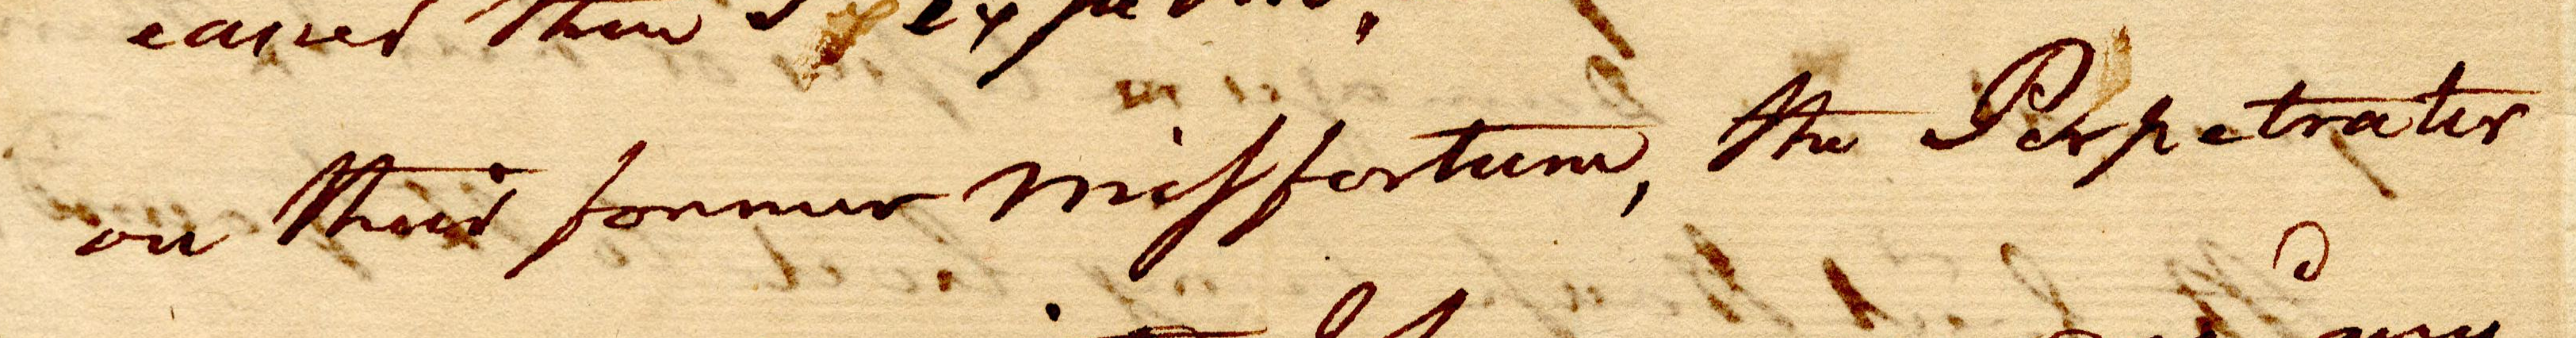on ther forner misfortune, the Perpatrator
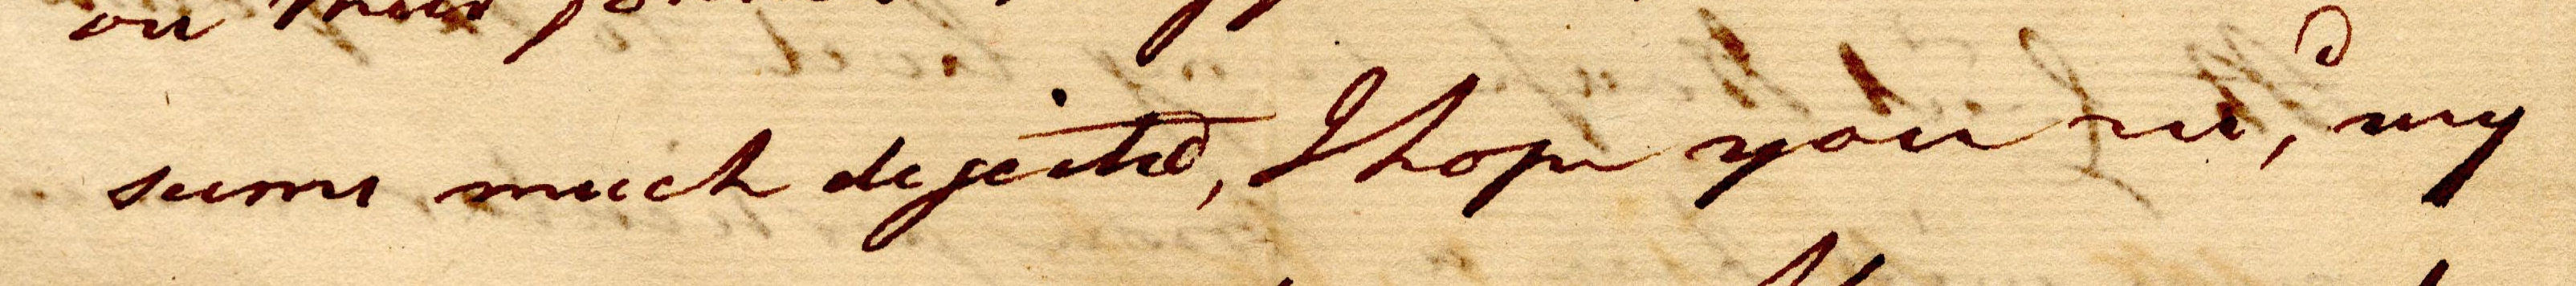seems much neglected, I hope you rec^d, my
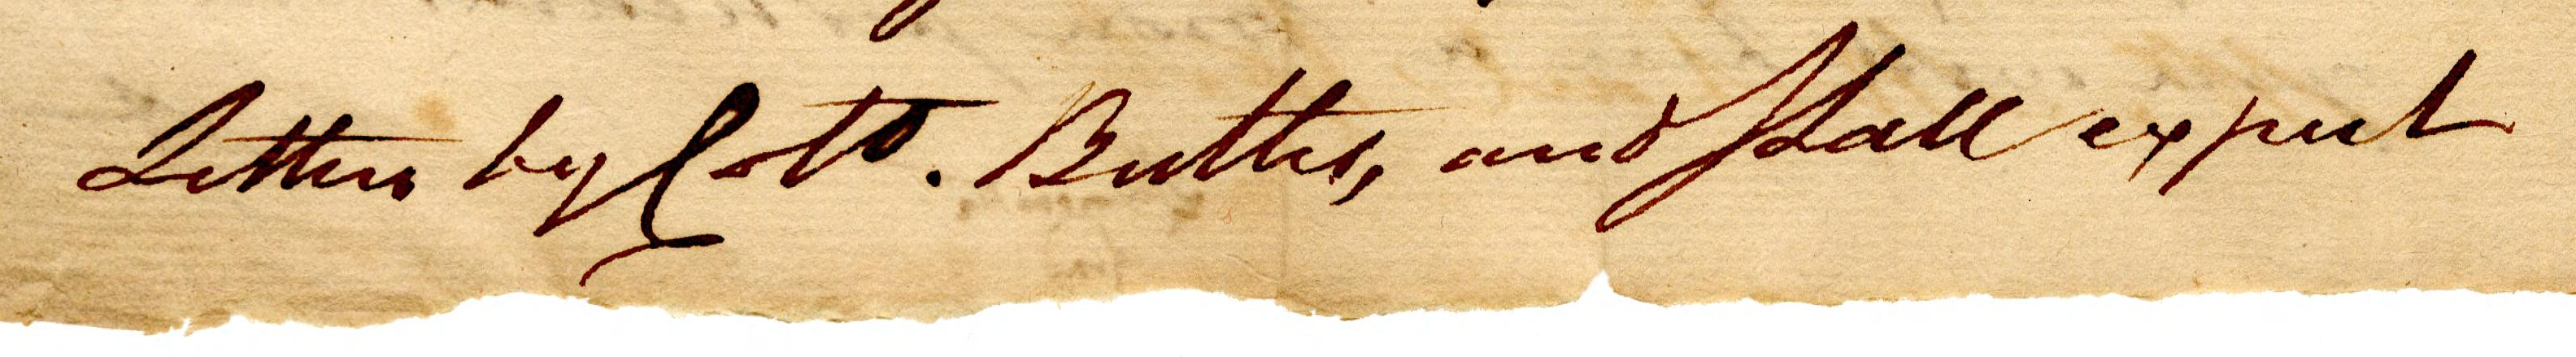Letters by Colo. Buttes, and shall expect
